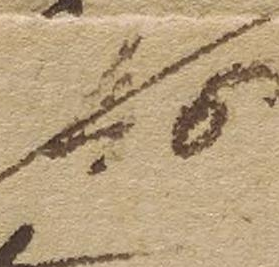46
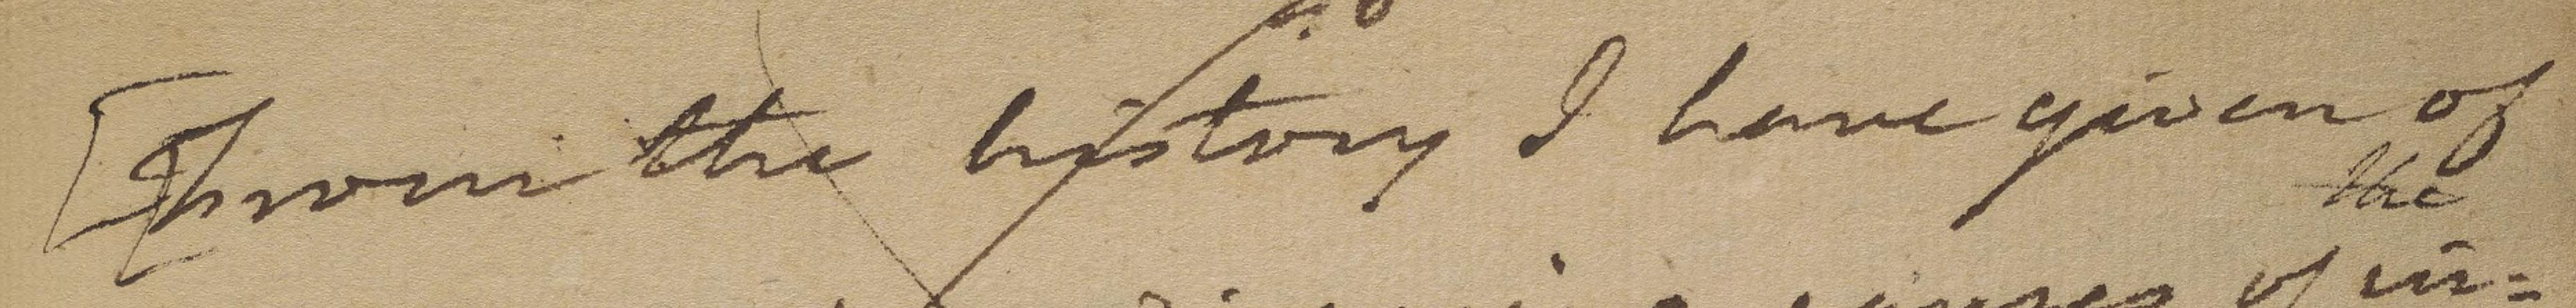(From the history I have given of
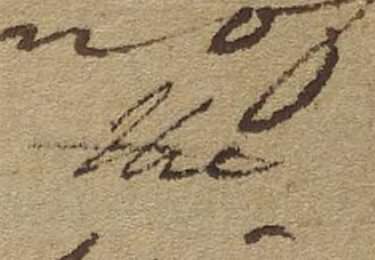the
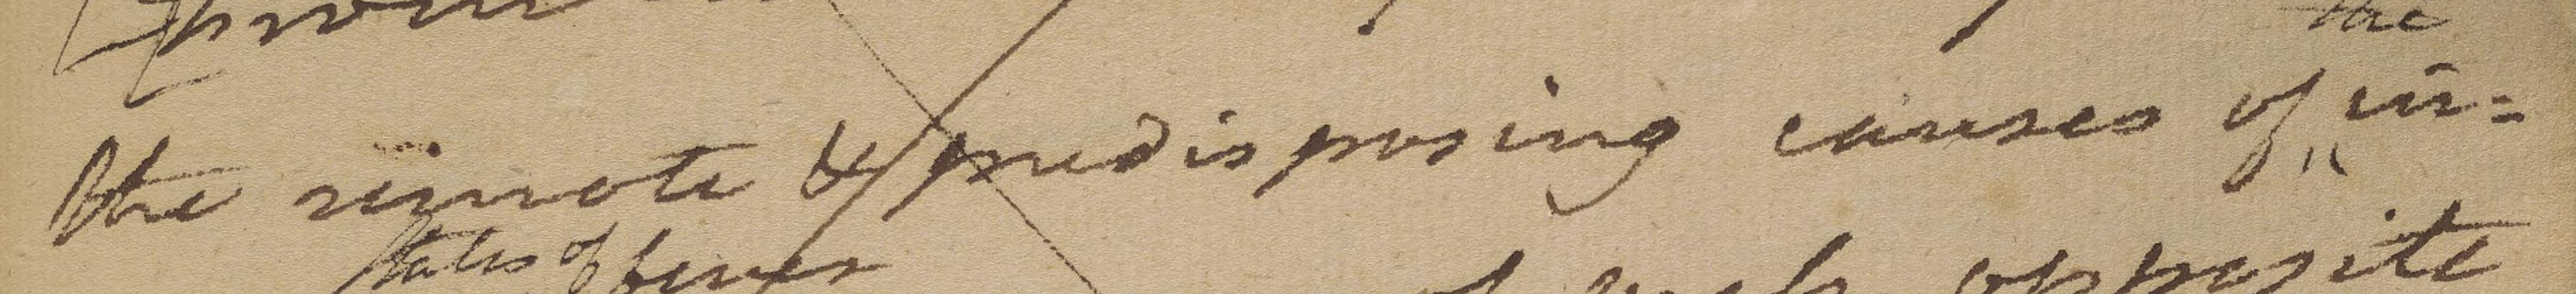the remote & predisposing causes of in-
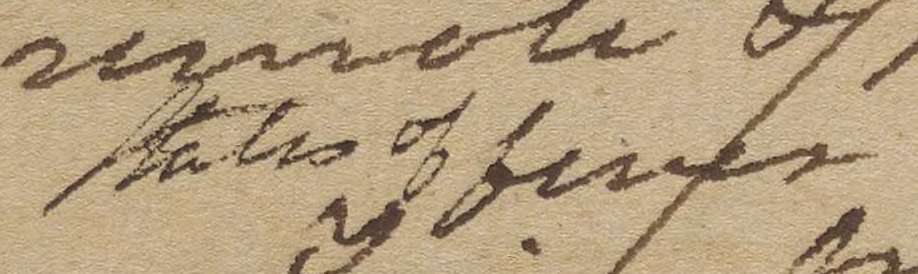states of fever
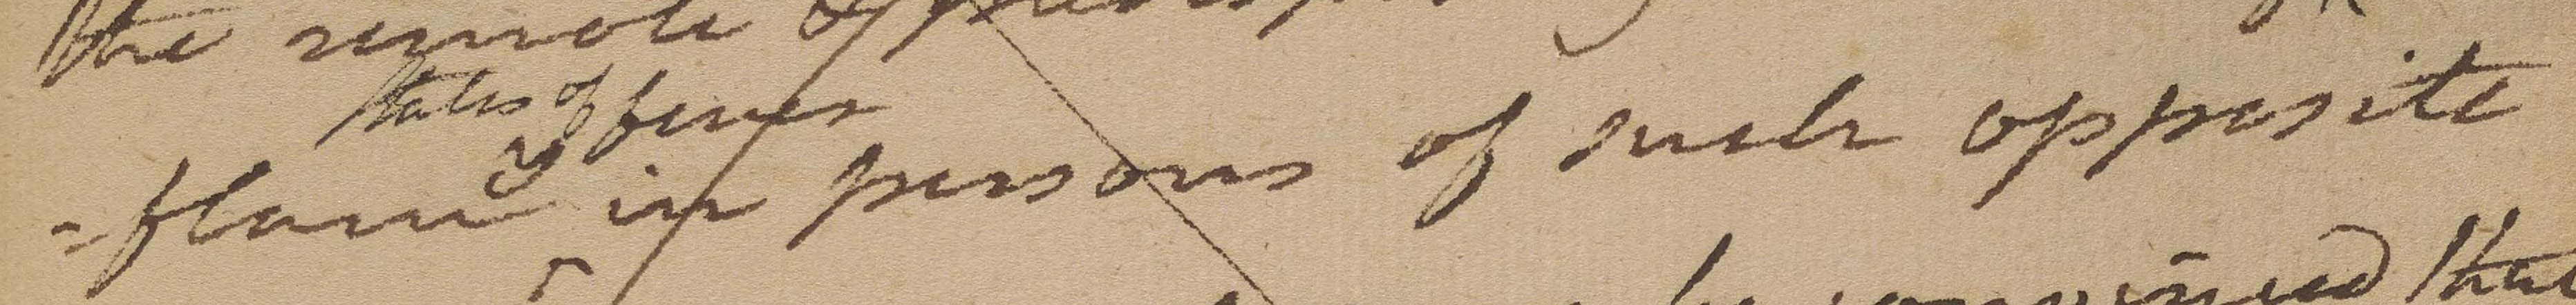-flam^y ^ in persons of such opposite
